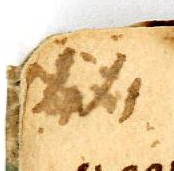44
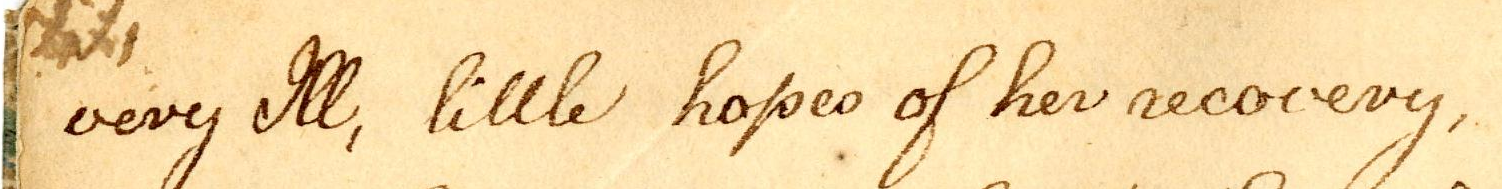very Ill, little hopes of her recovery,
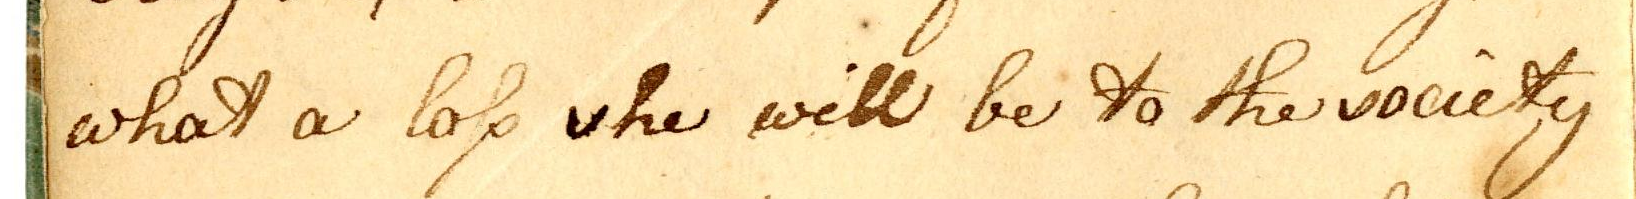what a loss she will be to the society
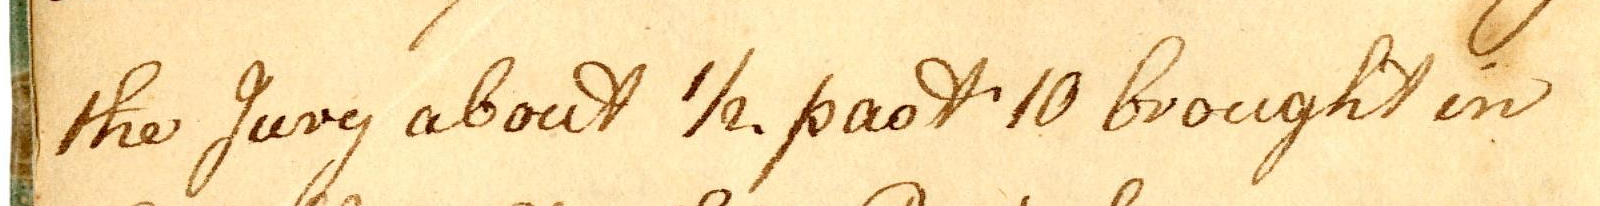the Jury about 1/2 past 10 brought in
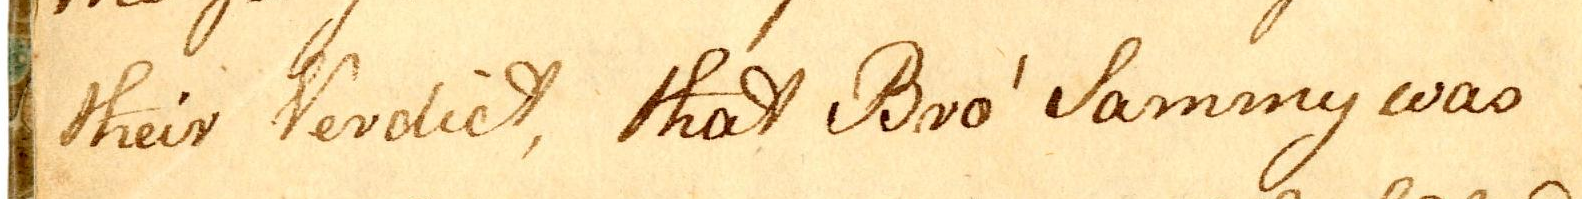their Verdict, that Bro' Sammy was
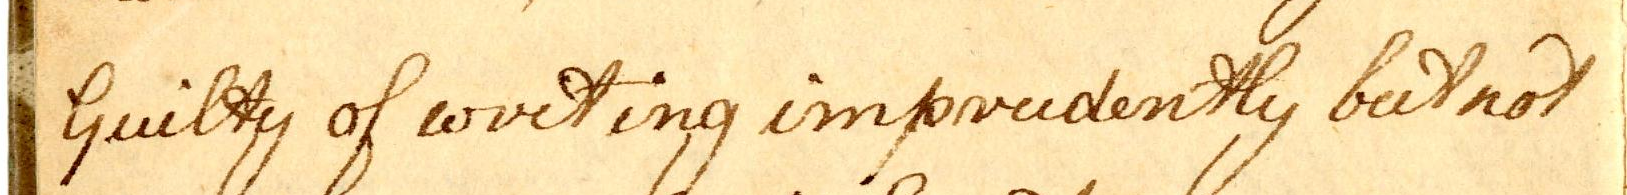Guilty of writing imprudently but not
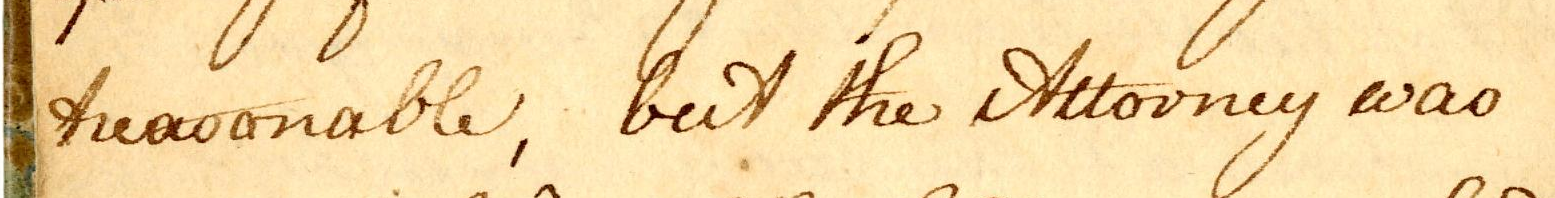treasonable, but the Attorney was
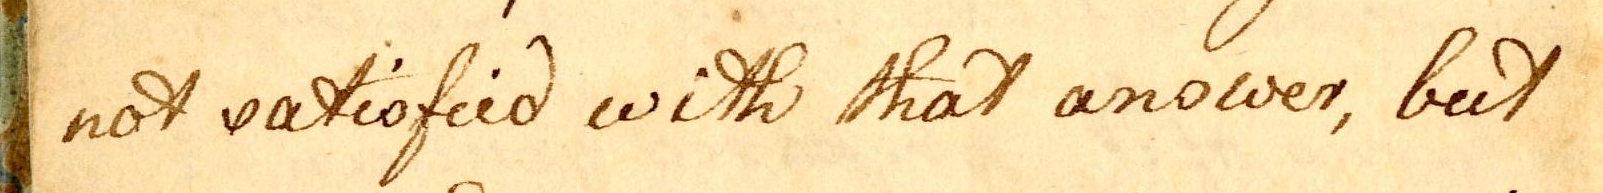not satisfied with that answer, but
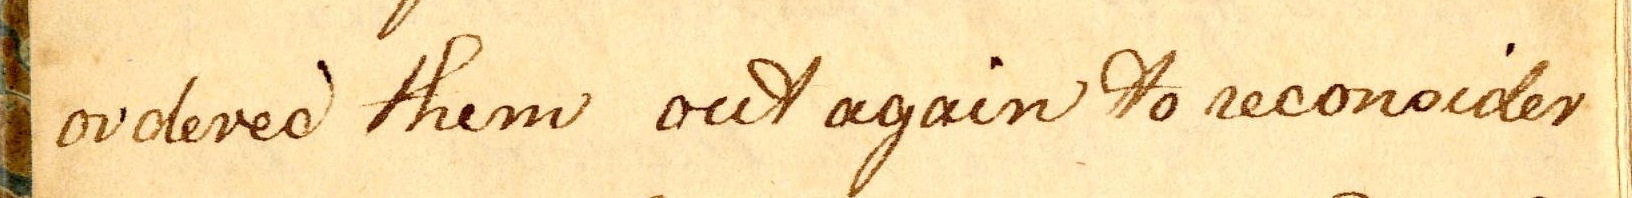ordered them out again to reconsider
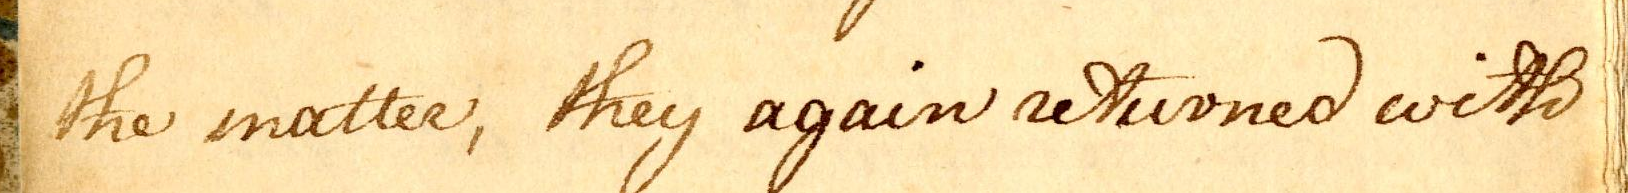the matter, they again returned with
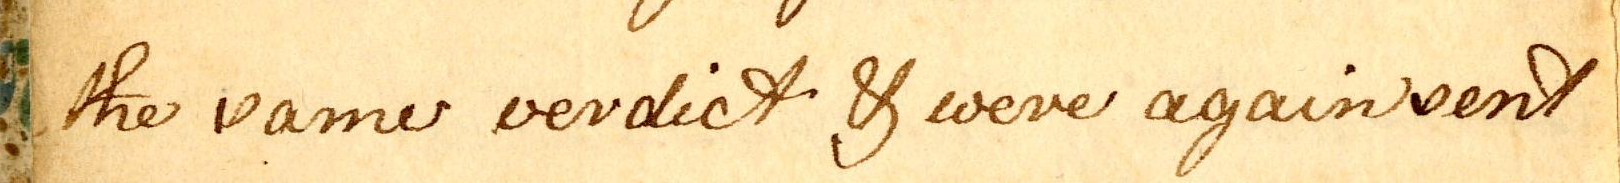the same verdict & were again sent
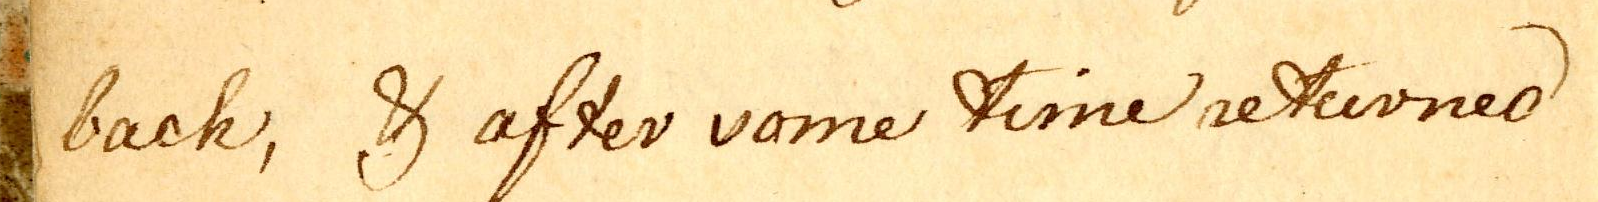back, & after some time returned
